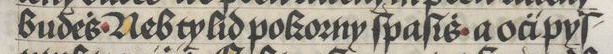budeṡ.Neb ty lid pokorny ſpaſiṡ.a oċí pyẛ¬
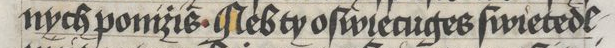nych poniżiṡ.Neb ty oſwiecuges ſwietedl¬
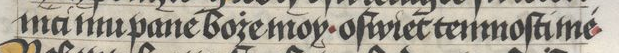nici mu pane boże moy.oſwiet temnoſti mé.
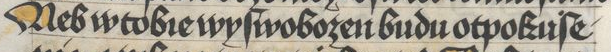Neb w tobie wyſwobozen budu otpokuẛe¬
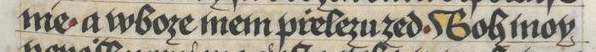nie.a wboze mem pṙelezu zed.Boh moy
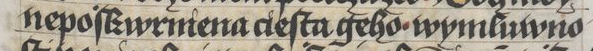nepoẛkwrniena cieſta geho.wymluwno¬
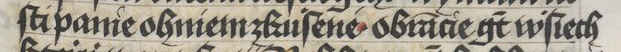ſti panie ohniem zkuẛené.obracie ḡt wẛiech
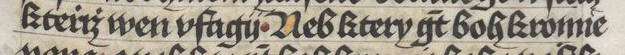kteṙiż weri ufagij.Neb ktery ḡt boh kromie
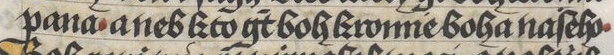pana.a neb kto ḡt boh kromie boha naẛeho.
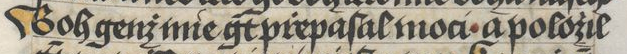Boh genż mie ḡt pṙepaſal moci.a polożil
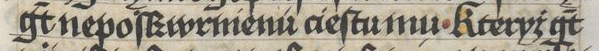ḡt nepoẛkwrnienú cieſtu mu.Kteryż ḡt
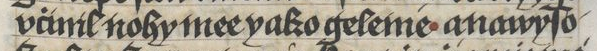uċinil nohy mee yako geleníe.anawyſo¬
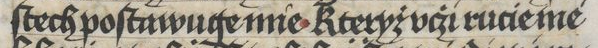ſtech poſtawuge mie.Kteryż ucżí rucie mé
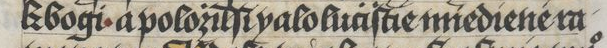k bogi.a polożilſi yalo luċiẛtie miediené ra¬
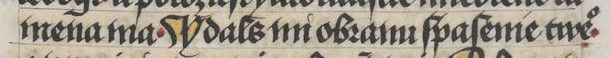mena ma.Ydals mi obranu ſpaſeníe tweo.
